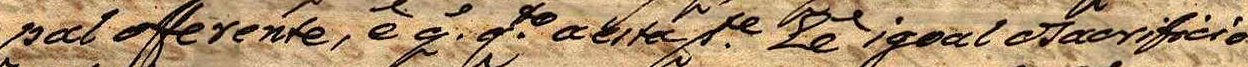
pal offerente, ê q̄ q.to a esta p.te hê igoal o sacrificio
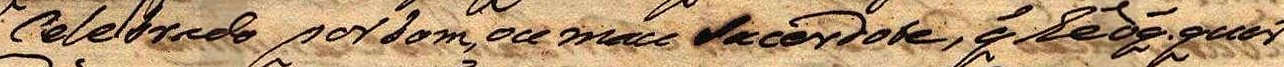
Celebrado por bom, ou mau sacerdote, q̄ hê o q̄ quer
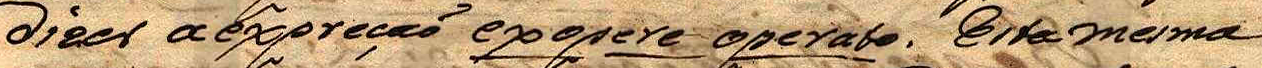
dizer a expreçaõ ex opere operato. Esta mesma
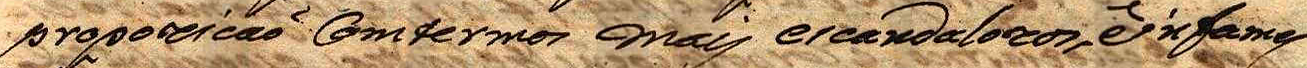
propozicaõ Com termos mais escandalozos, ê infames
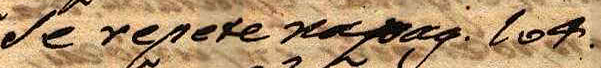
se repete na pag. 104.
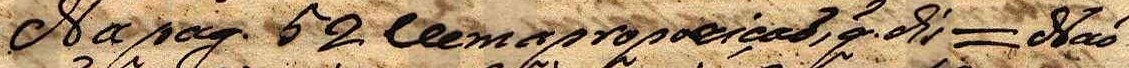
Na pag. 52 vem a propoziçaõ, q̄ dis = Naõ
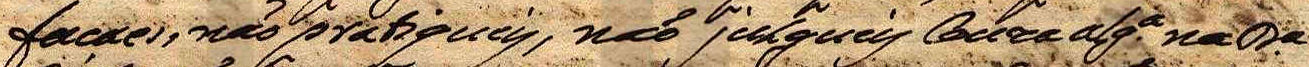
façaes, naõ pratiqueis, naõ julgueis Couza alg.a na D.a
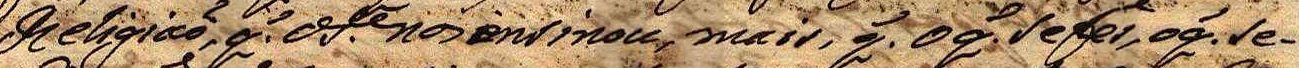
Religiaõ, q̄ o s.r nos ensinou, mais, q̄. o q̄ se fês, o q̄ se
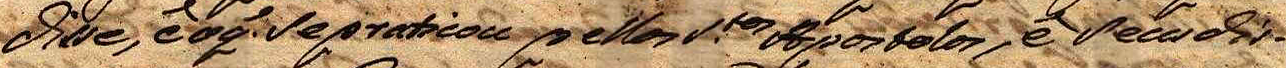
disse, ê o q̄. se praticou pellos s.tos Apostolos, ê seus dis
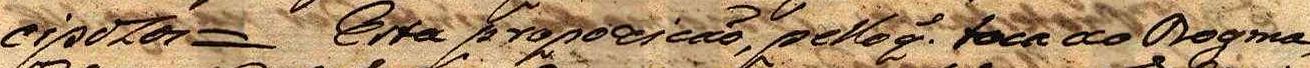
cipoLos = Esta propozicaõ, pello q̄ toca ao Dogma,
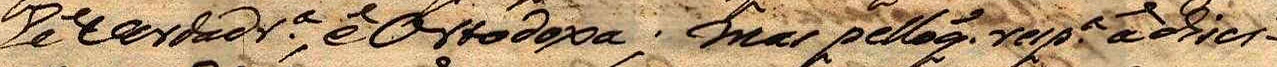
hê verdadr.a, ê Ortodoxa; mas pello q̄ resp.a â disci
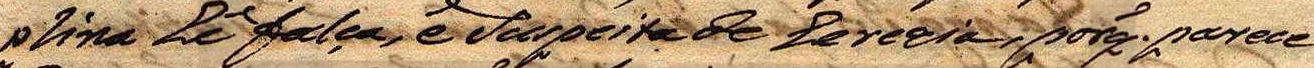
plina hê falça, ê suspeita de herezia, porq̄ parece
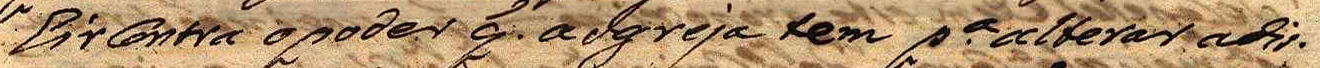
hir contra o poder q̄. a Igreja tem p.a alterar a dis
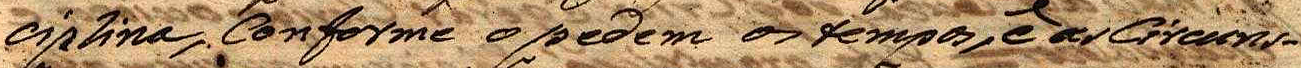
ciplina, conforme o pedem os tempos, ê as circuns
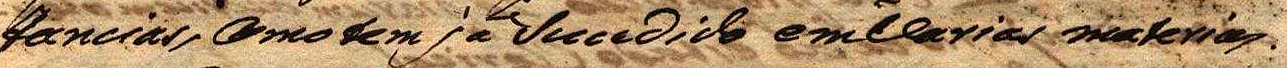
tancias, Como tem jâ sucedido em Varias materias.
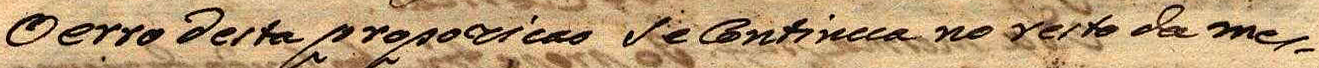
O erro desta propozicao se continua no resto da mes
